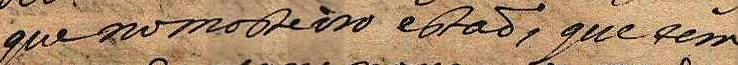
que no mosteiro estão, que tem
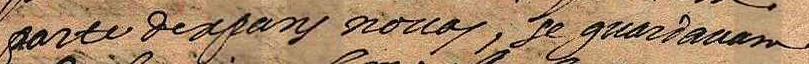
parte de xpans nouas, se guardauam
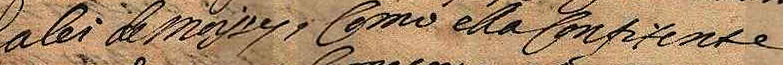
a lei de moyses, Como ella Confitente
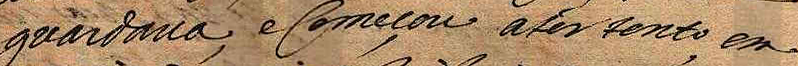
guardaua, e Começou a ter tento em
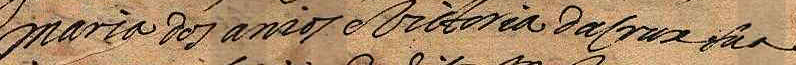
maria dos anios e Victoria da Crux sua
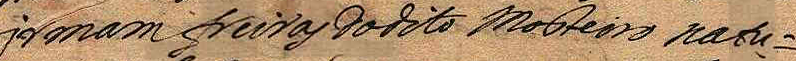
jrmam freiras do dito mosteiro natu
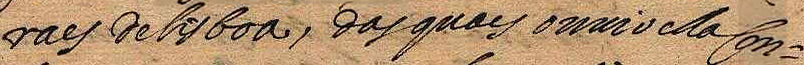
raes de lisboa, das quaes ouuio ella Con
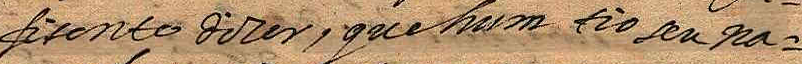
fitente dizer, que hum tio seu na
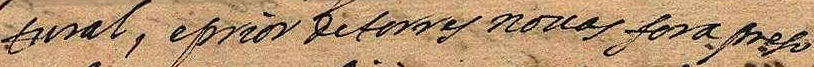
tural, e prior de torres nouas fora preso
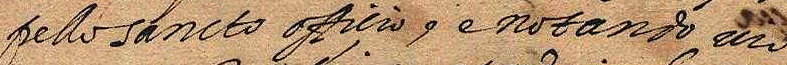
pello sancto offiçio, e notando uio
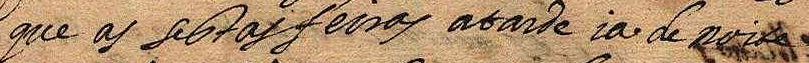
que as sestas feiras a tarde ia de noite
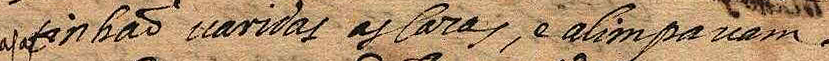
tinhão uaridas as Cazas, e alimpauam
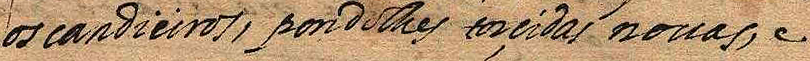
os candieiros, pondolhes torçidas nouas, e
